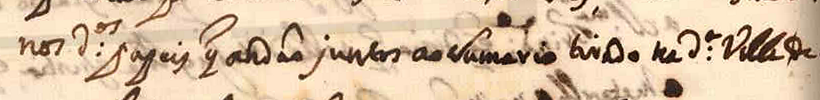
nos d.os papeis q̄ andaõ juntos ao Sumario tirado na d.a Villa de
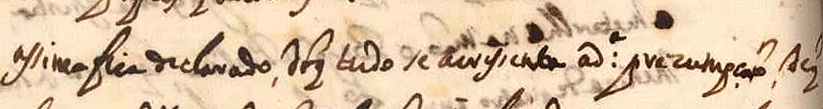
assima fica declarado, do q̄ tudo se acressenta a d.a prezumpçaõ de q̄
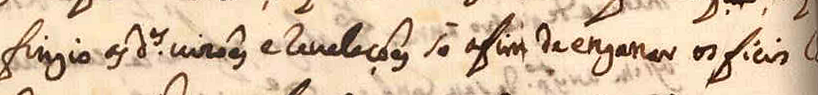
fingio as d.as uizoẽs e Reuelaçoẽs só a fim de enganar os fieis
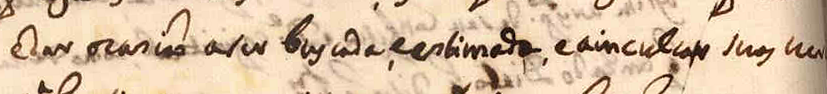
e dar ocaziaõ a ser buscada, e estimada, e a inculcar suas uer
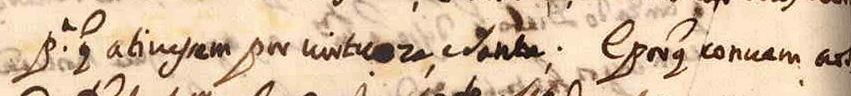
p.a q̄ a tiuessem por uirtuoza, e Santa; E porq̄ conuem aos
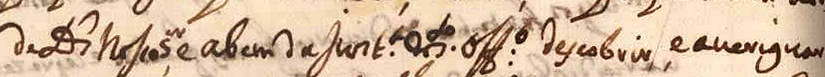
de Ds̄ Nosso Sor, e a bem da Just.a o s.to off.o descobrir, e aueriguar
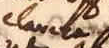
clareza
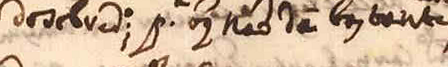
do sobred.o, p.a o q̄ naõ dá bastante
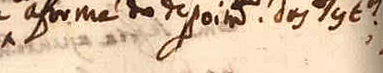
a forma do depoim.to das Testas.
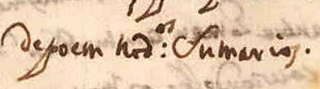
depoem no d.os Sumarios.
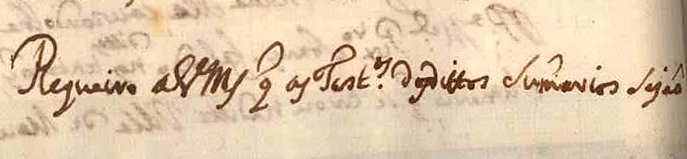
Requeiro a V Ms q̄ as Test.as dos dittos Sum̄arios sejaõ
